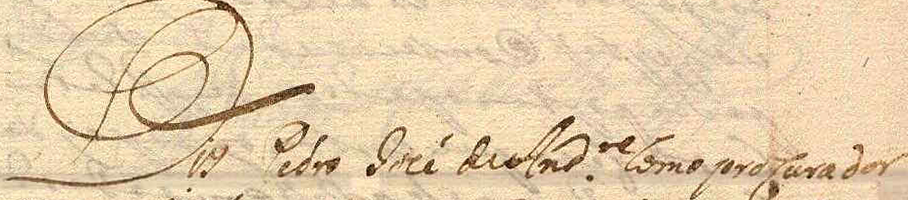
Dis Pedro Iozé de And.re Como proCurador
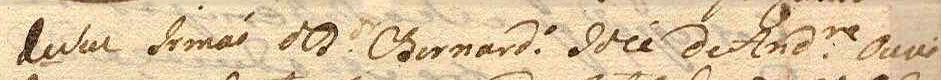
de seu Irmaõ o D.or Bernard.o Iozé de And.re Ouui
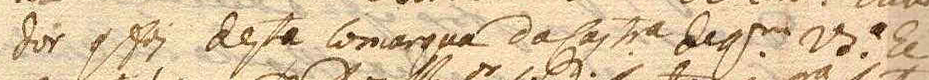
dor q foj desta Comarqua da Castr.a de q.m V s.a he
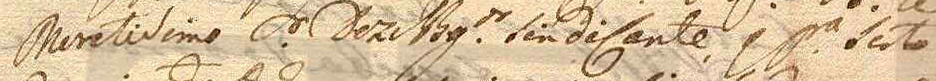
Meretisimo s.r Dezebg.or sindiCante, q p.ra serto
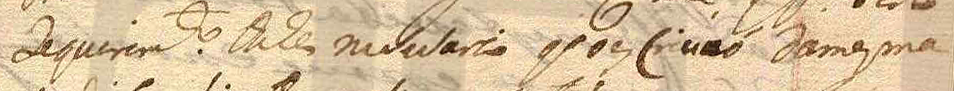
Requerim.to lhe he nesesario q̄ o esCriuaõ da mesma
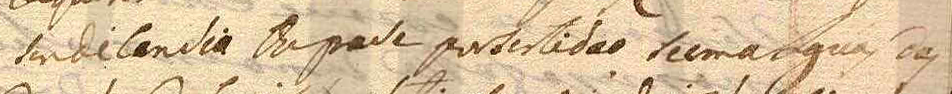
sendiCansia lhe pase por sertidao se em alguās das
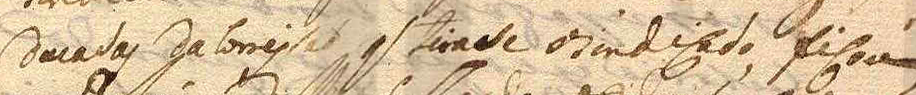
deuasas da Comessaõ q̄ tirase o sindiCado, fiCou
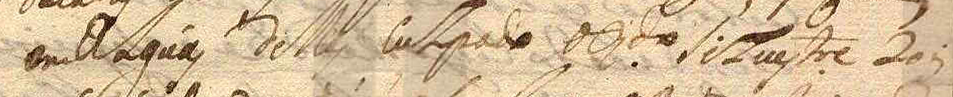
em Alguās dellas CuLpado o R.do SiLuestre Rois
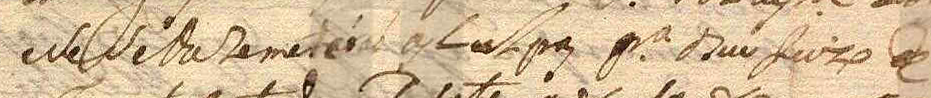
e se se lhe Remeteraõ as Culpas p.a o seu Juizo Ec
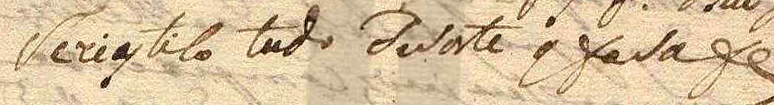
cleziastico tudo de sorte q fasa fe
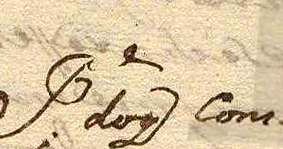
P.e do q̄ cons
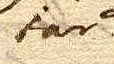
tar
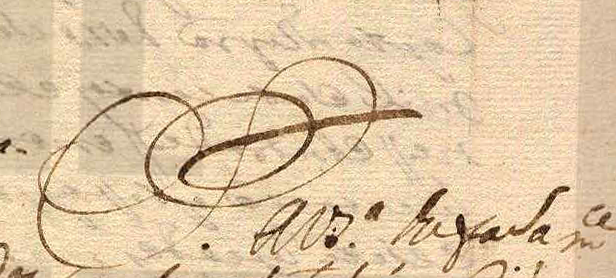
P. a V S.a lhe fasa mce
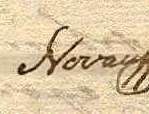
Novaes
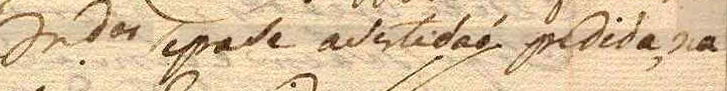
m.dos se pase a sertidaõ pedida, na
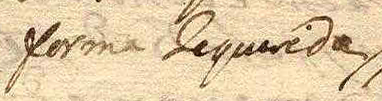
forma Requerida
